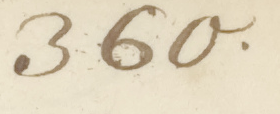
360
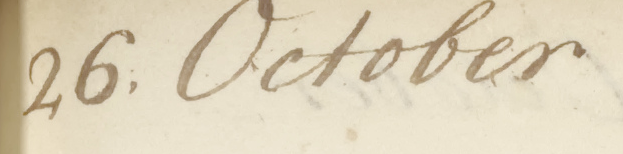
26 october
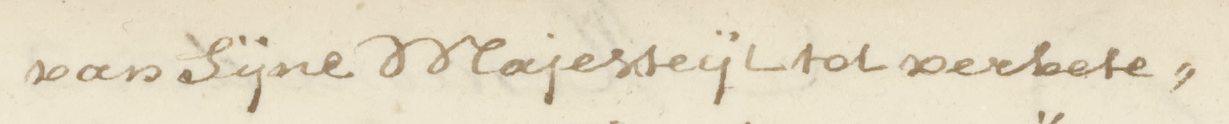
van Sijne Majesteijt tot verbete„
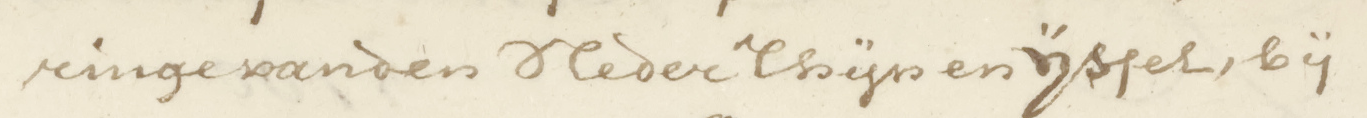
ringe vanden Neder Rhijn en IJssel, bij
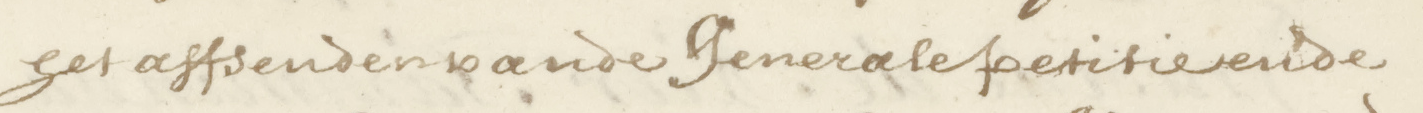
het affsenden vande Generale petitie ende
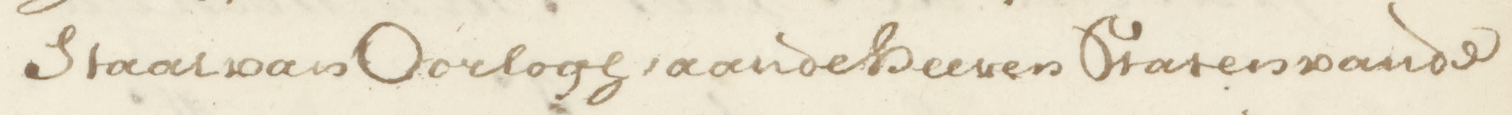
Staat van Oorlogh, aan de heeren Staten vande
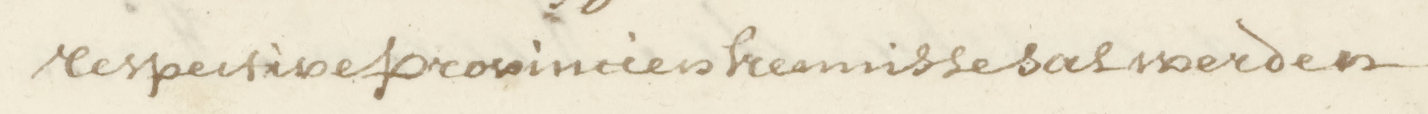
respective provincien kennisse sal werden
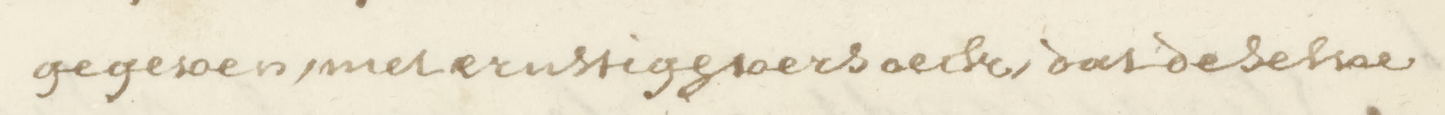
gegeven, met ernstigh versoek dat de selve
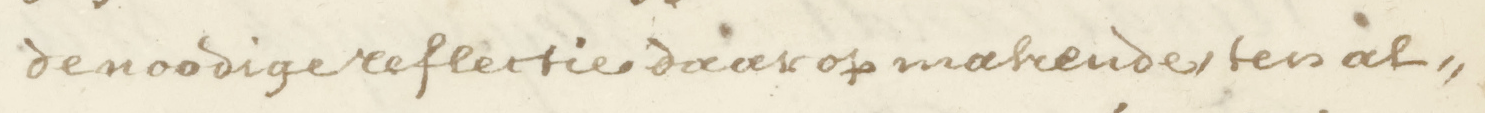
de noodige reflectie daar op makende ten al„
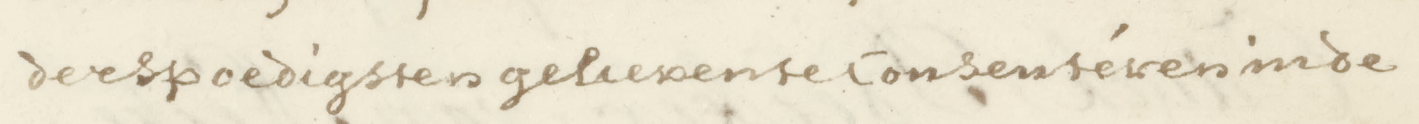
derspoedigsten gelieven te consenteren in de
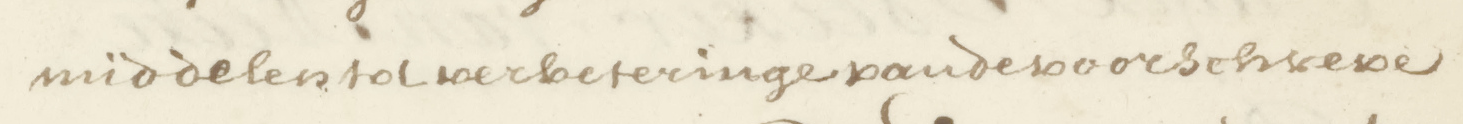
middelen tot verbeteringe vande voorschreve
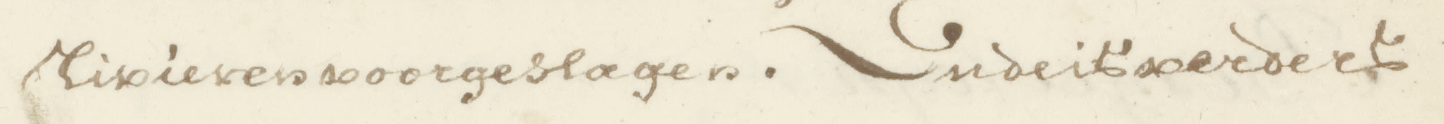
rivieren voorgeslagen. Ende is verders
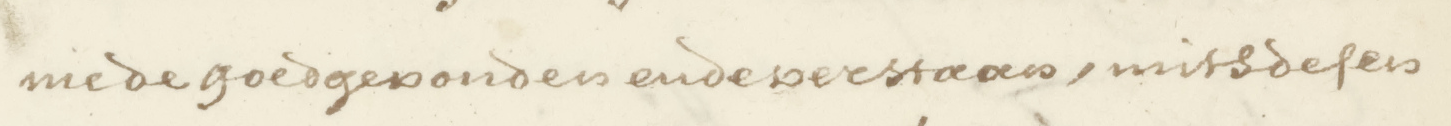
mede goedgevonden ende verstaan, mits desen
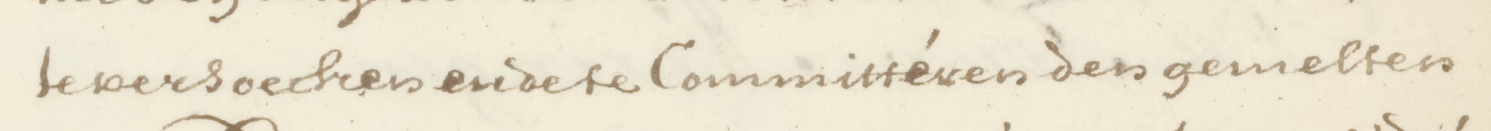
te versoecken ende te committeren den gemelten
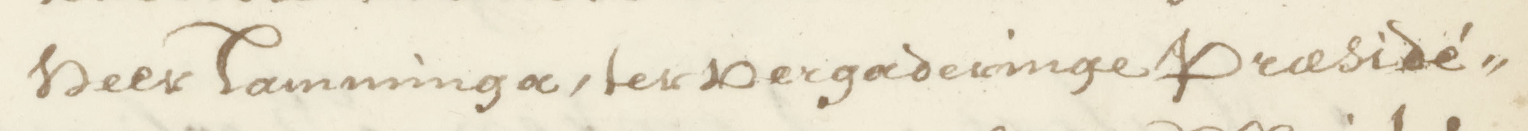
heer Tamminga, ter vergaderinge preside„
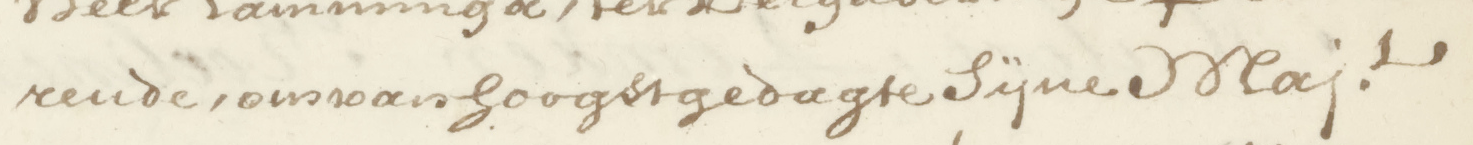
rende, om van hoogstgedagte Sijne Majt
